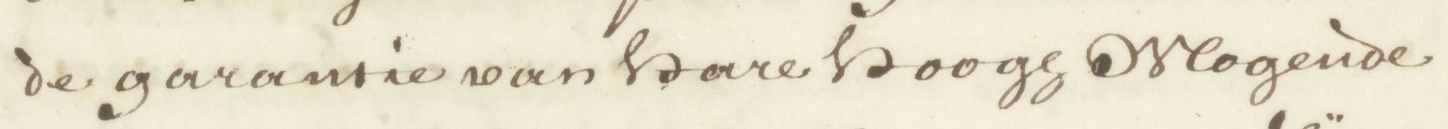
de garantie van hare Hoogh Mogende
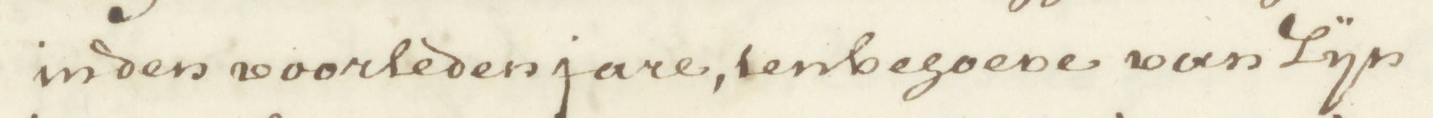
inden voorleden jare, ten behoeve van zijn
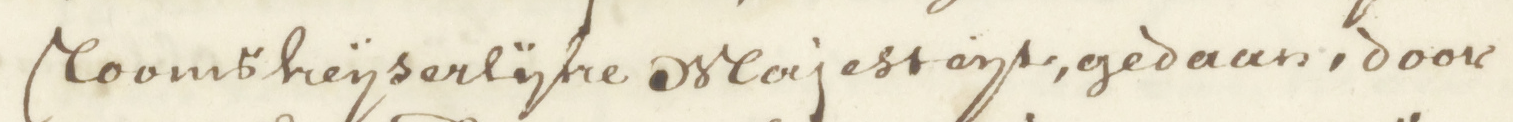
roomskeijserlijke Majesteijt, gedaan, door
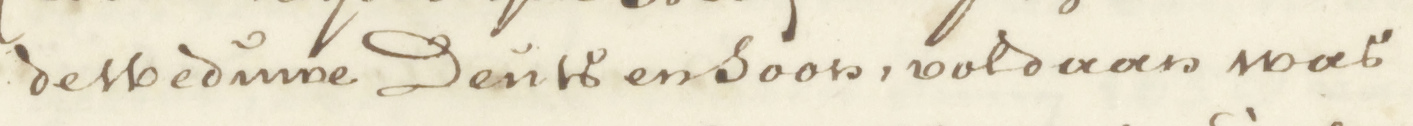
de weduwe Deuts en soon, voldaan was
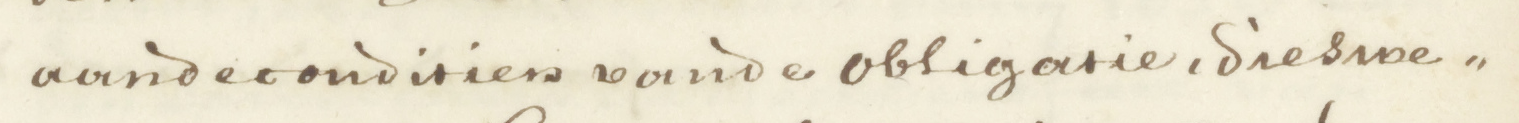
aande conditien vande obligatie, dieswe„
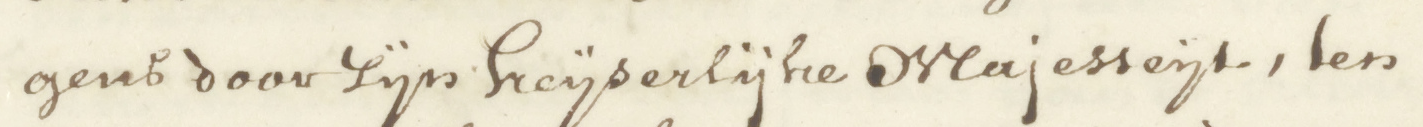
gens door zijn keijserlijke Majesteijt, ten
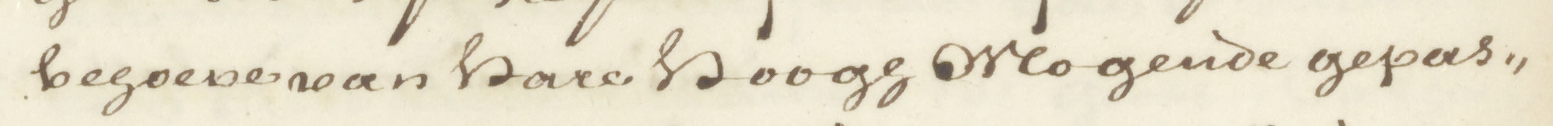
behoeve van hare Hoogh Mogende gepas„
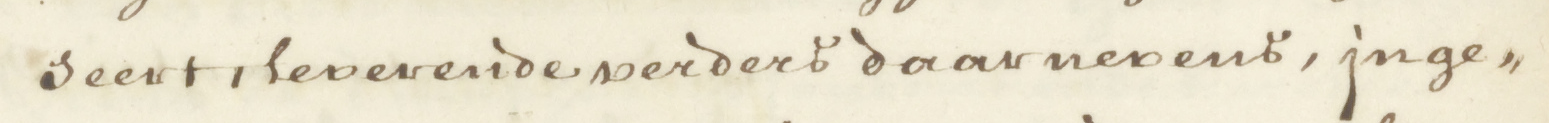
seert, leverende verders daar nevens, inge„
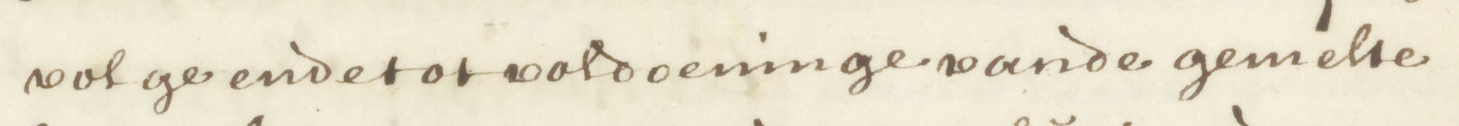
volge ende tot voldoeninge vande gemelte
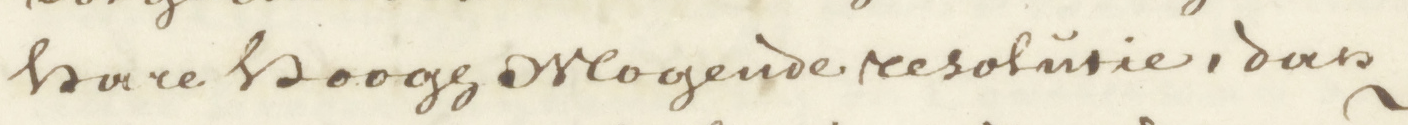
hare Hoogh Mogende resolutie, dan
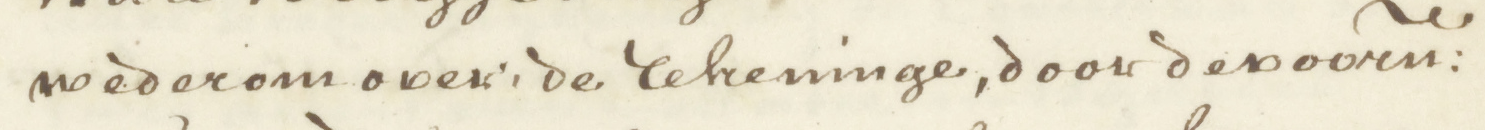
wederom over de rekeninge, door de voorn:
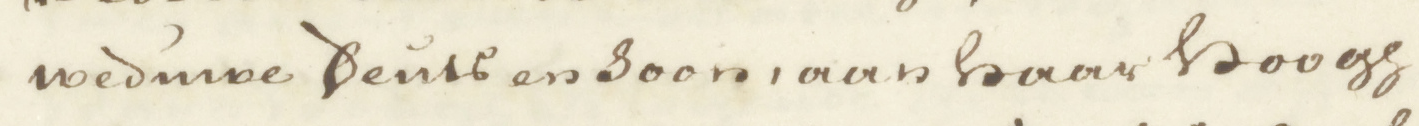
weduwe Deuts en soon, aan haar Hoogh
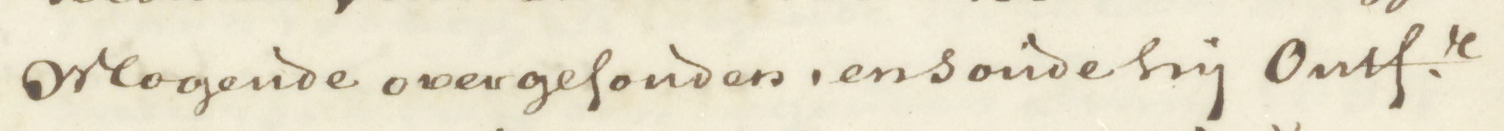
Mogende overgesonden, en soude hij Ontfr.
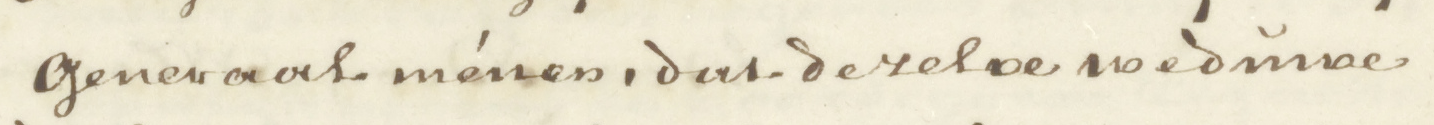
Generaal menen dat dezelve weduwe
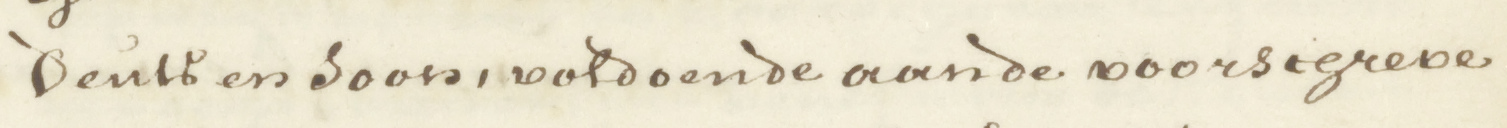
Deuts en soon, voldoende aande voorschreve
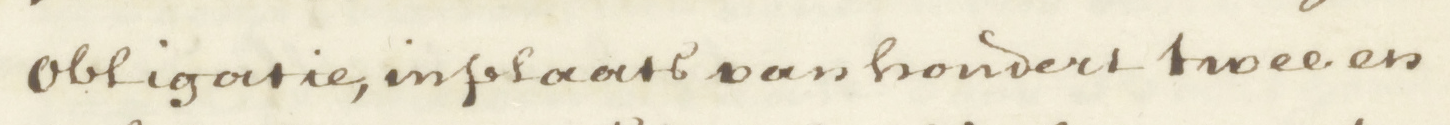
Obligatie, in plaats van hondert twee en
